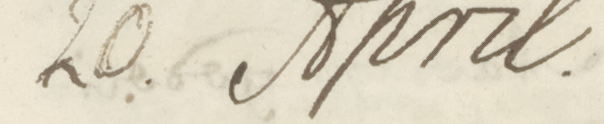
20. April.
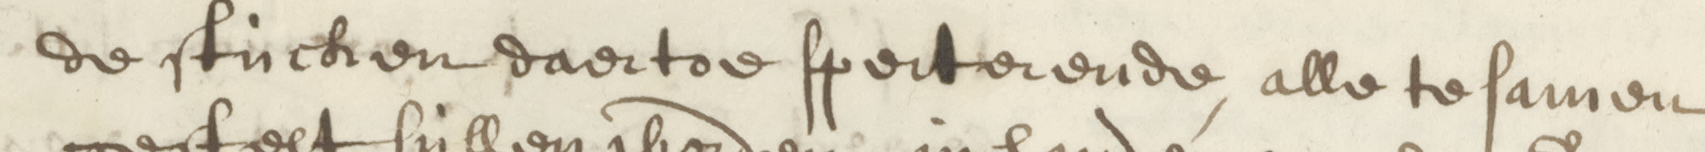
de stucken daertoe specterende alle te samen
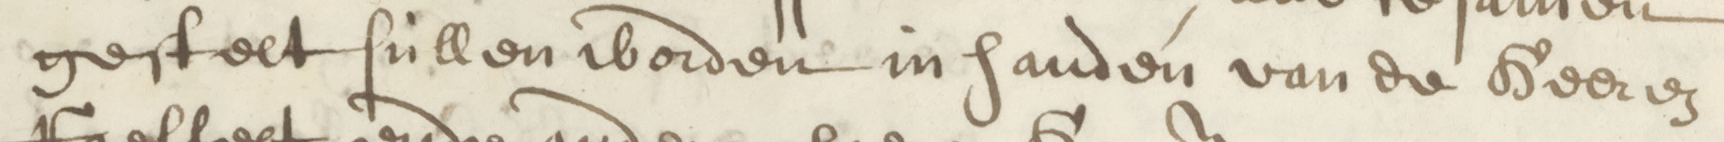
gestelt sullen worden in handen van de Heeren
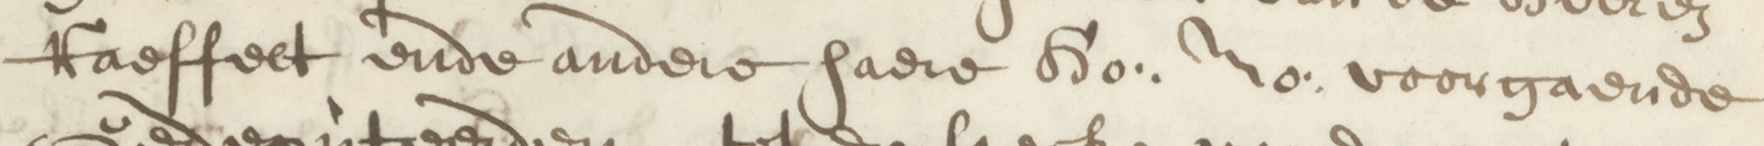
Raesfelt ende andere haere Ho:Mo: voorgaende
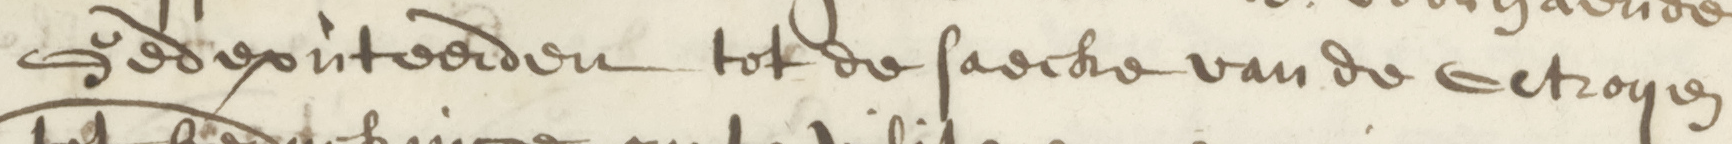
Gedeputeerden tot de saecke van de Octroyen
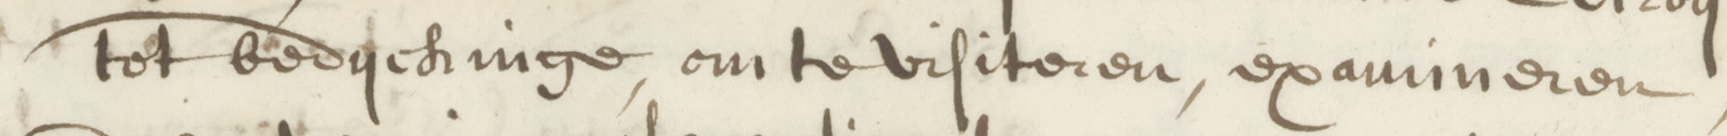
tot bedyckinge, om te visiteren, examineren,
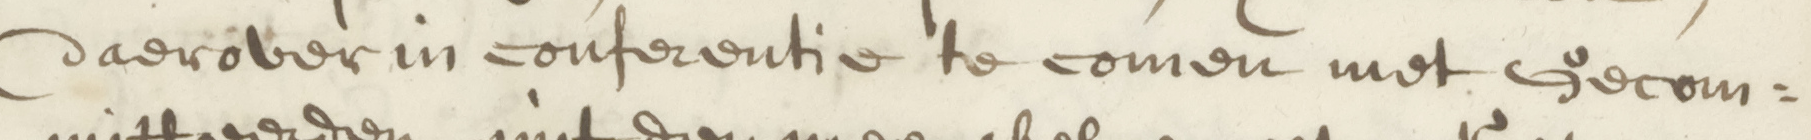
daerover in conferentie te comen met Gecom=
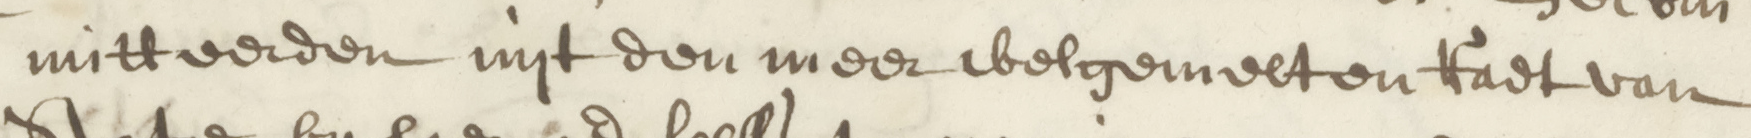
mitteerden uyt den meer welgemelten Raet van
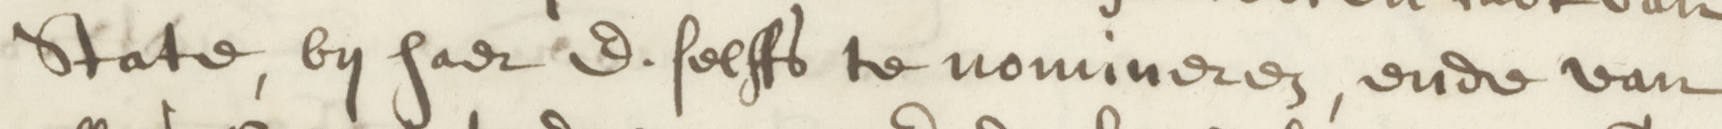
State, by haer E. selffs te nomineren, ende van
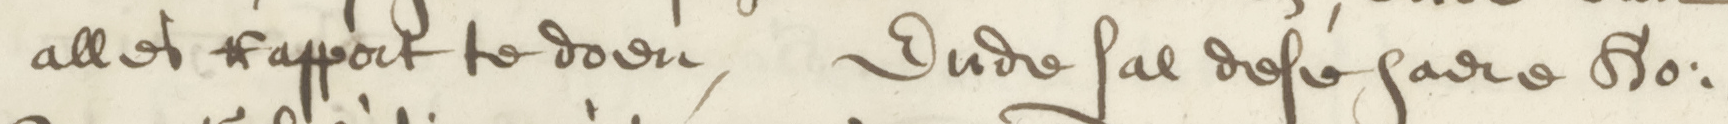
alles rapport te doen. Ende sal dese haere Ho:
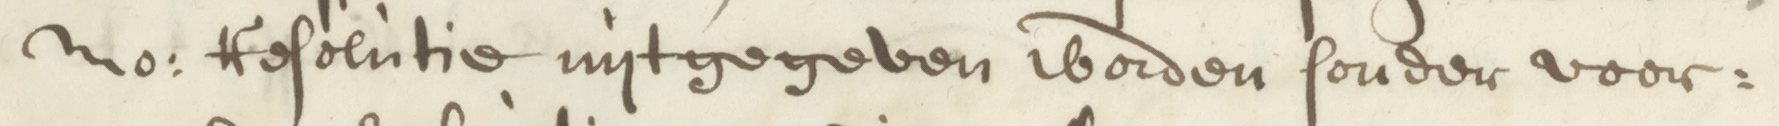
Mo: Resolutie uytgegeven worden sonder voor=
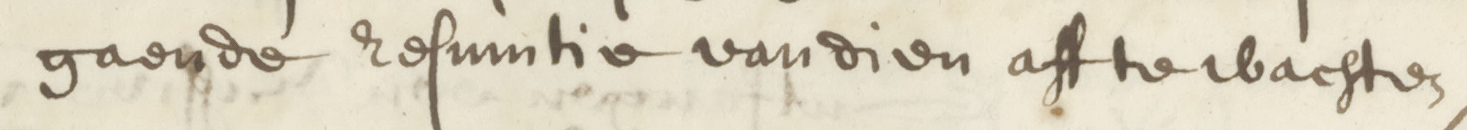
gaende resumtie vandien aff te wachten.
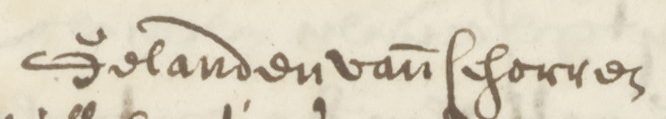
Gelanden van schorren
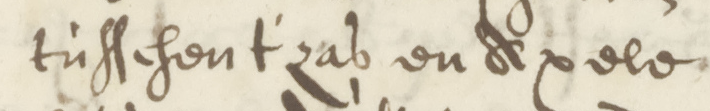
tusschen t‛ zas en Axele
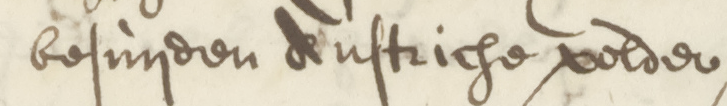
besuyden Austriche polder
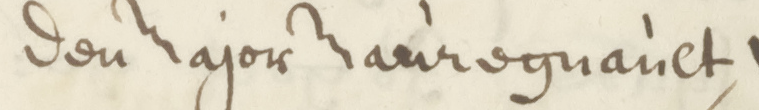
Den Major Mauregnault
